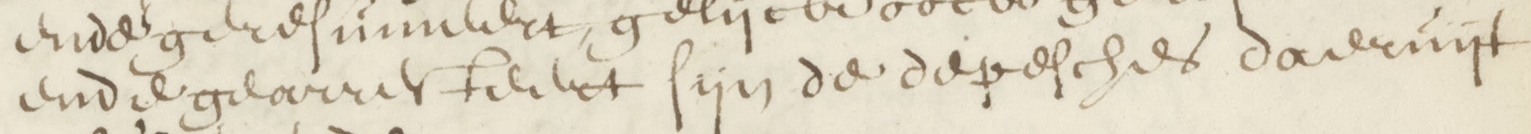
ende gearresteert sijn de depesches daeruijt
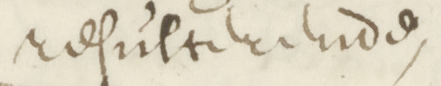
resulterende.
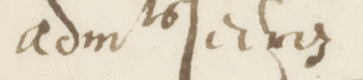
Admts. heeren
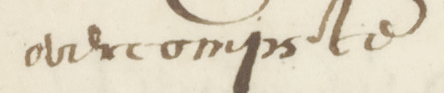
overcompste
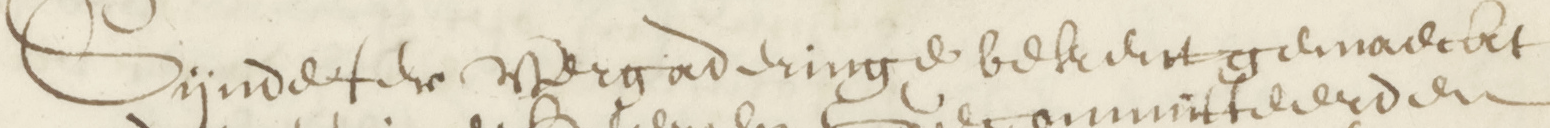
Sijnde ter Vergaderinge bekent gemaeckt
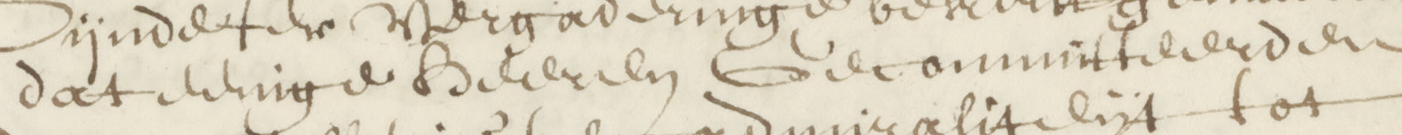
dat eenige Heeren Gecommitteerden
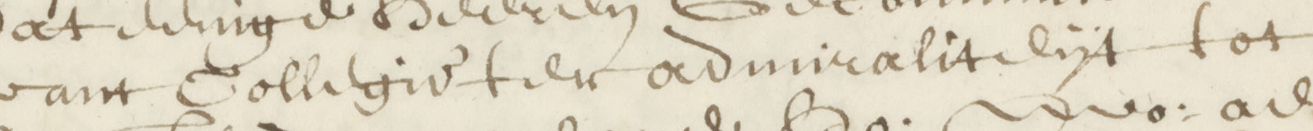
vant Collegie ter admiraliteijt tot
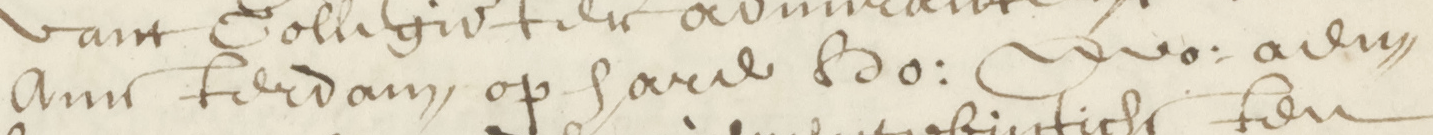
Amsterdam, op hare Ho:Mo: aen,,
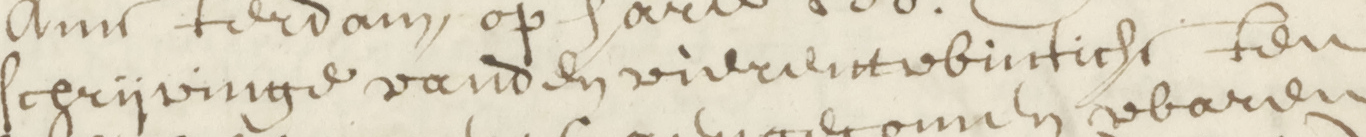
schrijvinge vanden vierentwintichsten
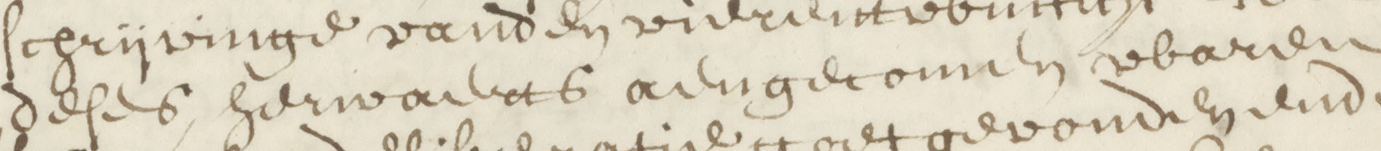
deses herwaerts aengecomen waren
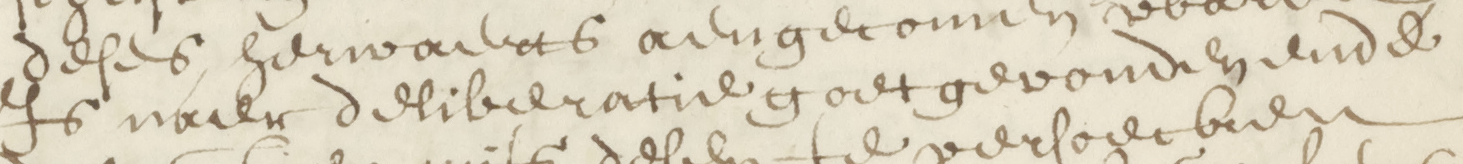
Is naer deliberatie goetgevonden ende
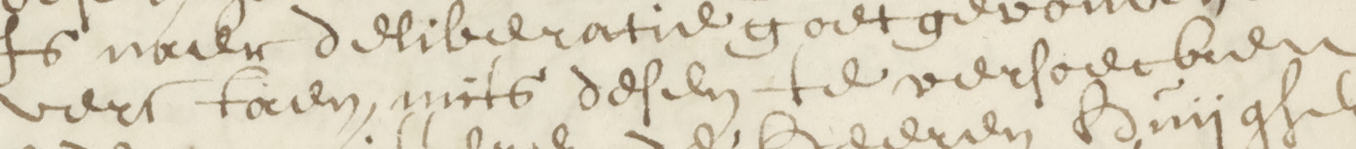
verstaen, mits desen te versoecken
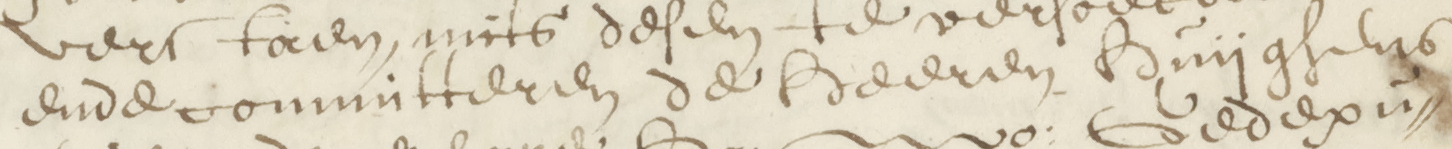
ende committeren de Heeren Huijghens
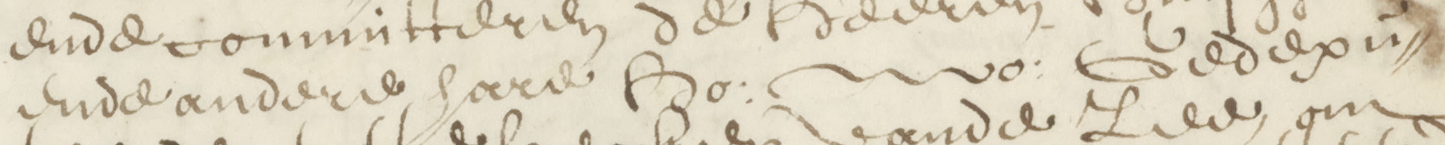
ende andere hare Ho:Mo: Gedepu„
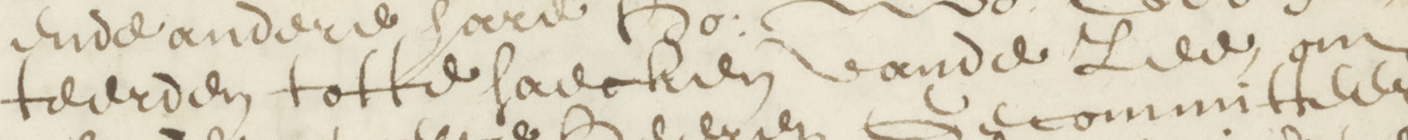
teerden totte saecken vande Zee, om
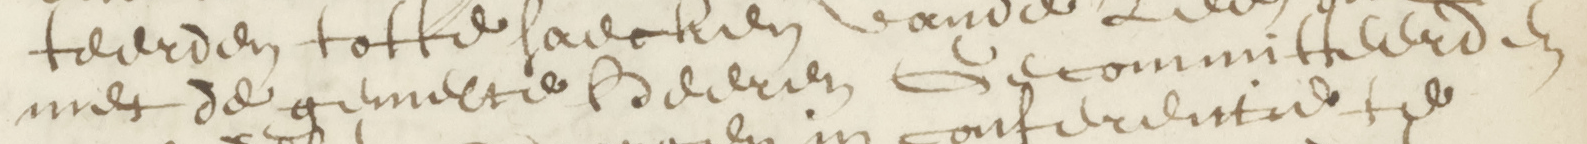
met de gemelte Heeren Gecommitteerden
